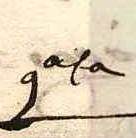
9a ta
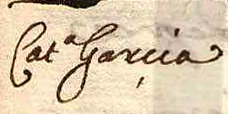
Cata Garcia
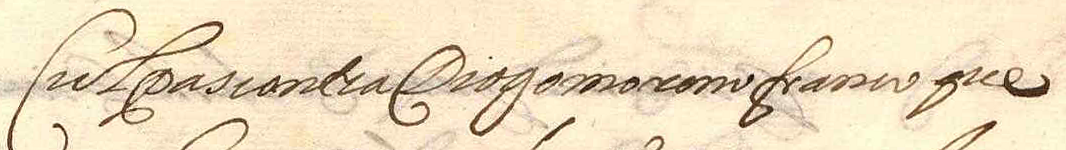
Culpas contra Diogo moreno franco que
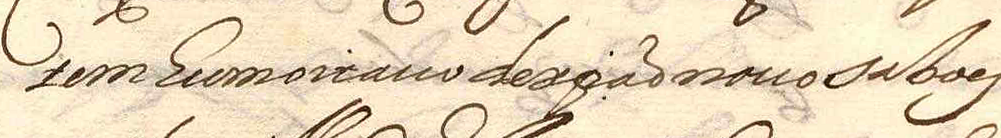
tem hum oitauo de xpaõ nouo saboej
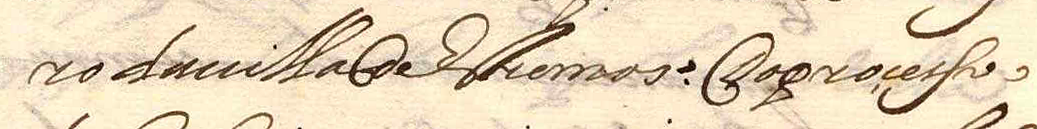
ro da uilla de Estremos. Do processo
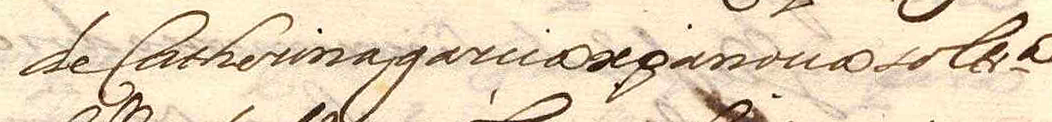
de Catherina garcia xpa noua soltr.a
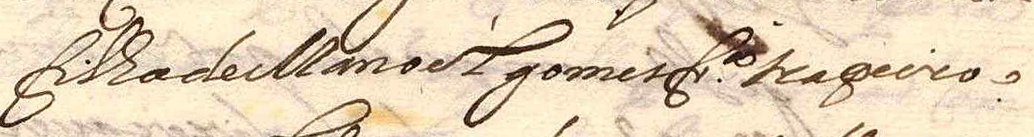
filha de Manoel gomes fr.a trapeiro
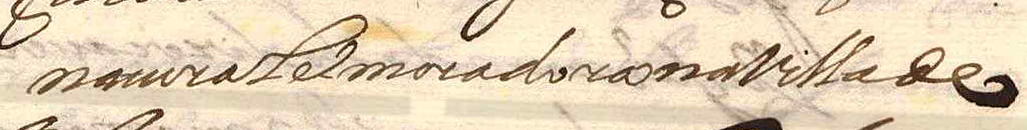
natural e moradora na Villa de
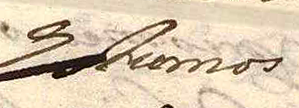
Estremos
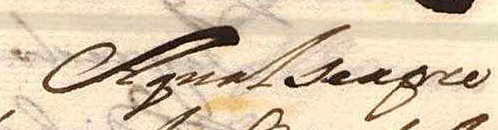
A qual se apre
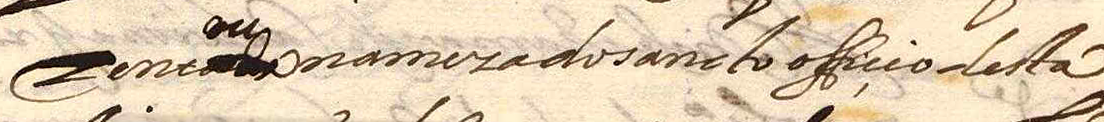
zentou na meza do sancto officio desta
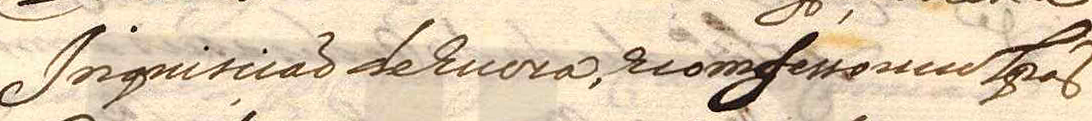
Jnquisiçaõ de Euora, E comfessou culpas
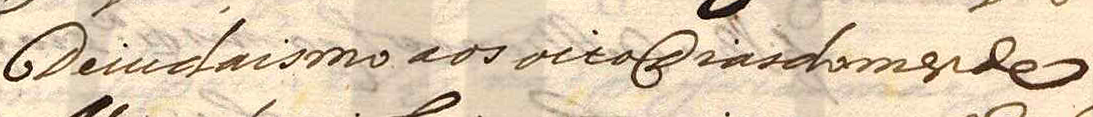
De iudaismo aos oito Dias do mes de
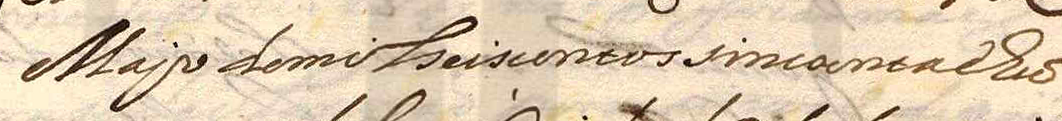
Majo de mil seiscentos sincoenta e hū
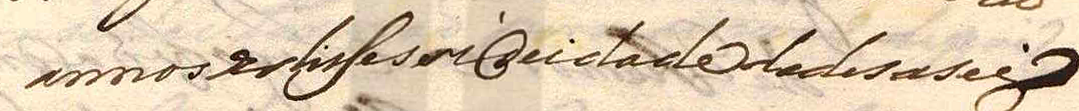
annos E disse ser de idade de desaseis
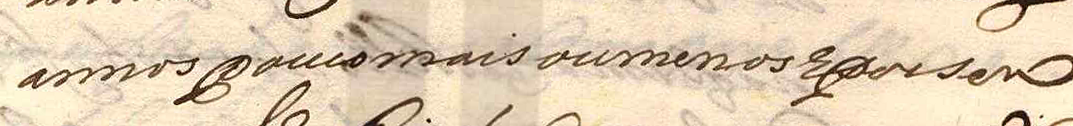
annos pouco mais ou menos E por ser
